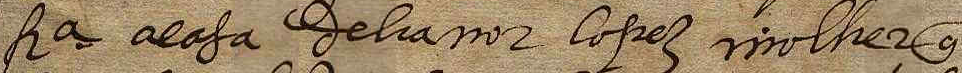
fra a casa de lianor lopez molher q̅
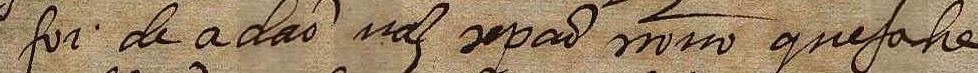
foi de adaõ uaz xpaõ nouo que Ja he
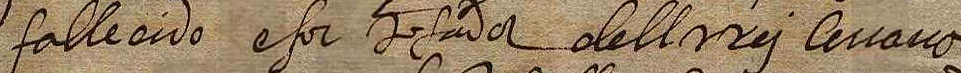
fallecido e foi tosador dell rrej leuaua
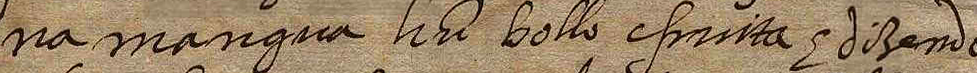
na mangua hu̅ bollo e fruita E dizendo
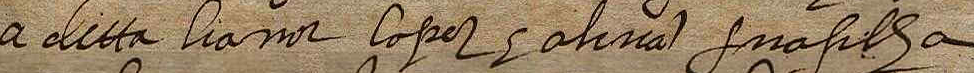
a ditta lianor lopez E a hua̅ sua filha
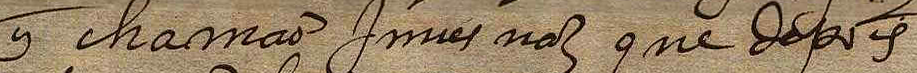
q̅ chamaõ Jnnes uaz que depois
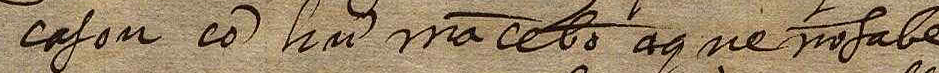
casou co̅ hu̅ ma̅cebo a que no̅ sabe
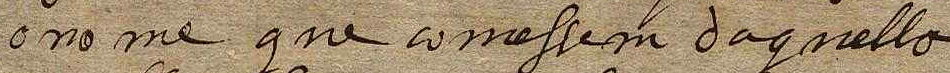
o nome que comessem daquella
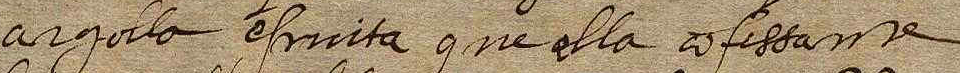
argola e fruita que ella co̅fessante
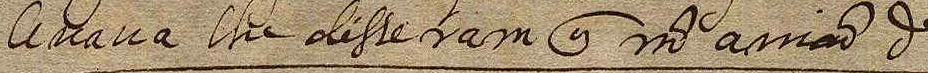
leuaua lhe disseram q̅ no̅ auiaõ de
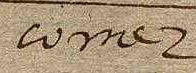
comer
